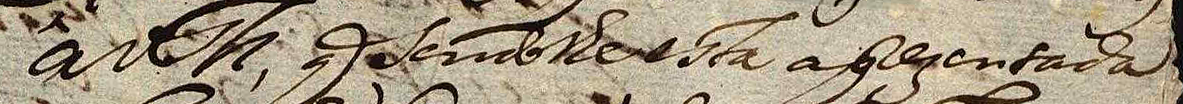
a v M, q̄ sendolhe esta aprezentada
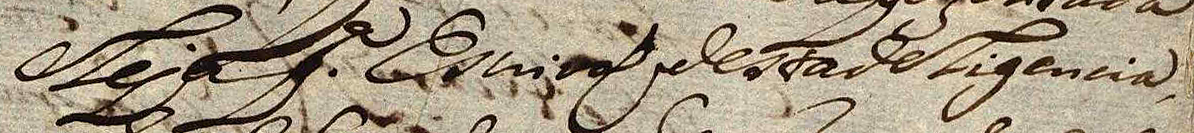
eLeja p.a Escrivaõ desta deligencia,
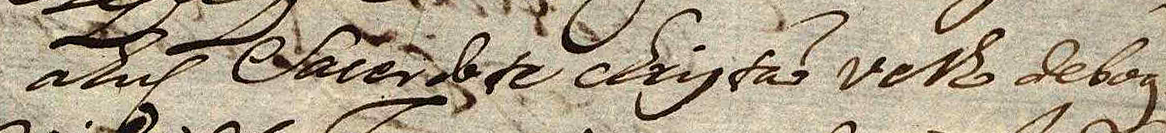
a hū Sacerdote christaõ velho de boa
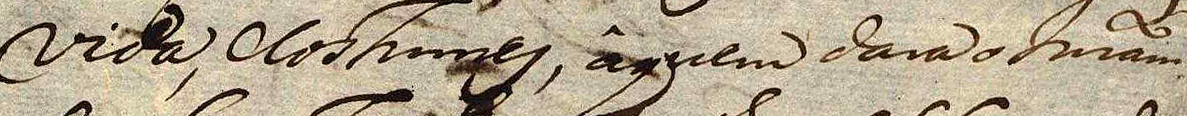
vida e costumes, a quem dara o Iuram.to
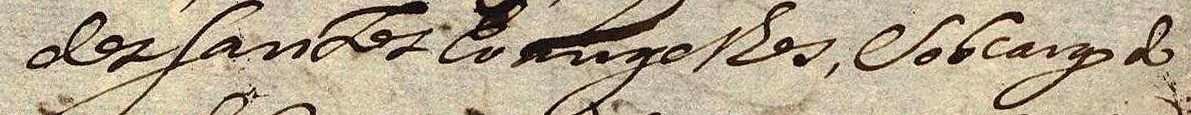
dos Santos Evangelhos, Sob cargo do
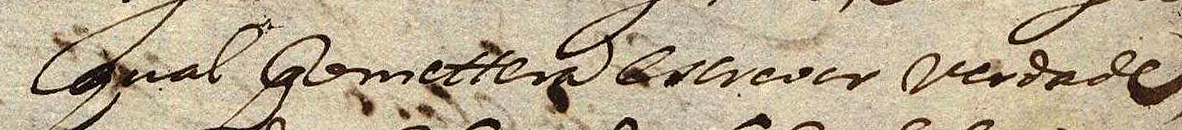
qual pRomettera escrever verdade,
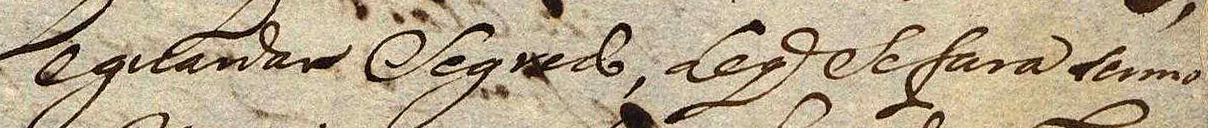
e guardar Segredo, de q̄ Se fara termo
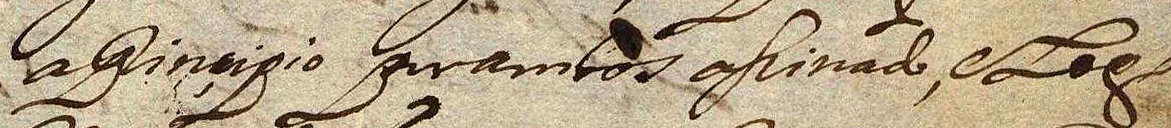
a pRincipio por ambos assinado, e Logo
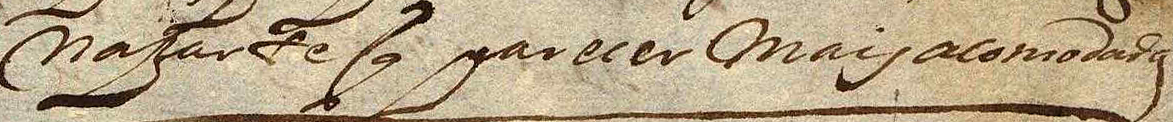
na parte q̄ parecer mais acomodada
